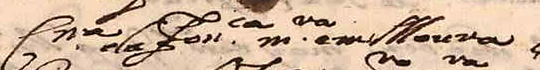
C.na da Fon.ca m.ra em Moura
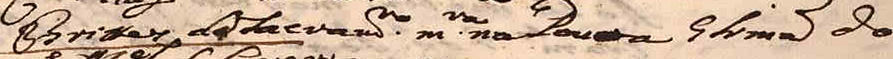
Brittes do Sacramto. mra na Pouoa E Irmā do
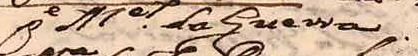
p.e M.el da Guerra
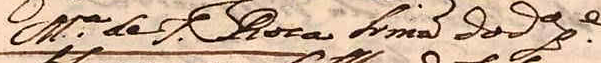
M.a de S. Roza Irmā do do p.e
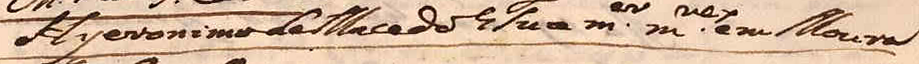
Hyeronimo de Macedo E sua m.er m.res em Moura
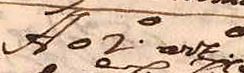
Ao 2o arto.
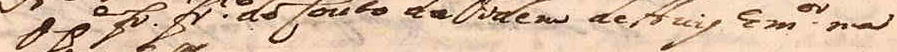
O pe fr. frco do Couto da Ordem de Auis E mor na
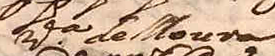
V.a de Moura
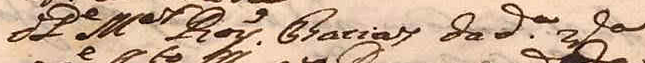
o P.e M.el Rois̄ Bacias da d.a V.a
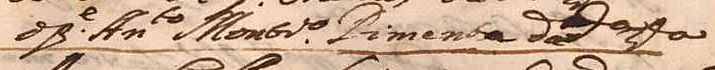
o p.e Anto Montr.o Pimenta da da Va
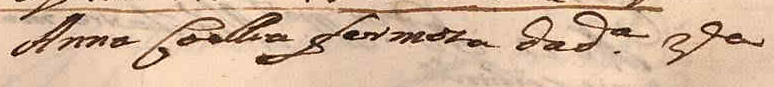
Anna Coelha fermoza da d.a V.a
